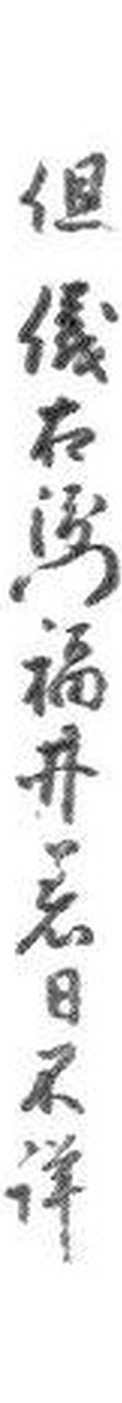但儀右衛門福井着日不詳
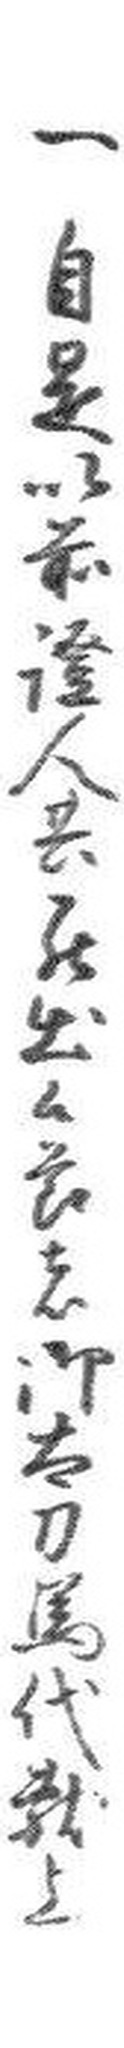一自足以前証人共罷出候節者御太刀馬代献上
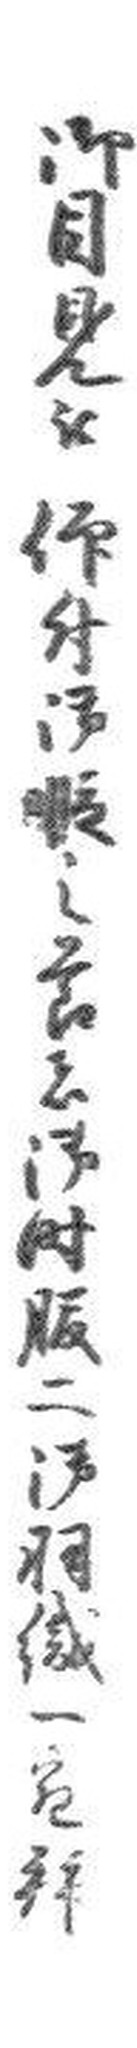御目見被仰付御暇之節者御時服二御羽織一宛拝

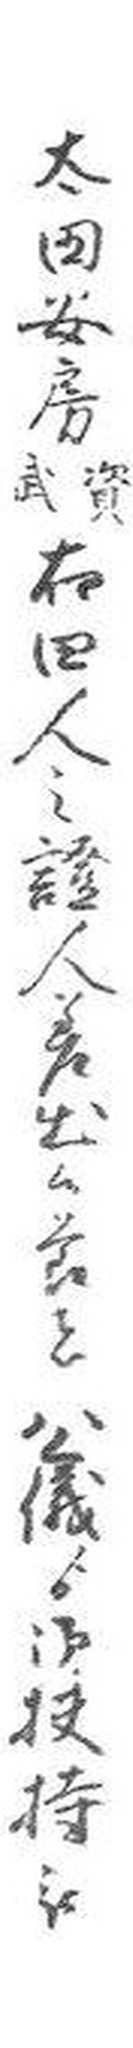太田安房資武右四人之証人差出候節者公儀ゟ御扶持被
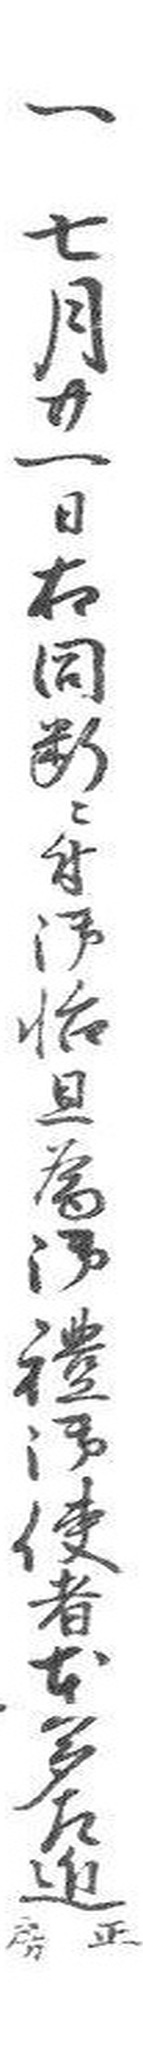一七月廿一右同断ニ付御怡且為御礼御使者本多左近正房
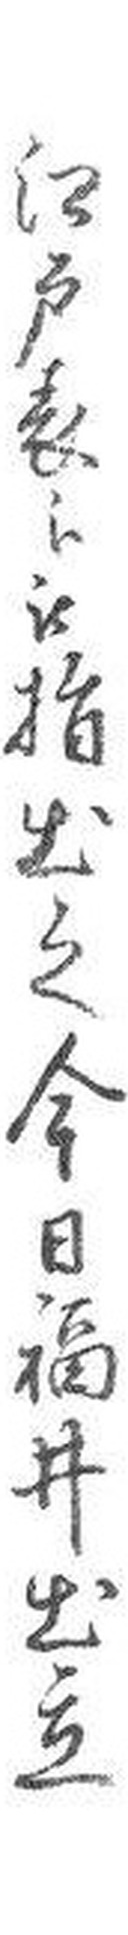江戸表江被指出之今日福井出立
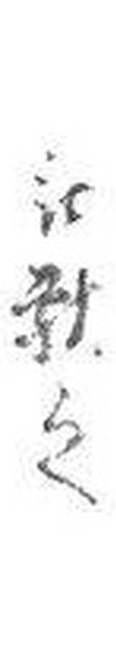被献之
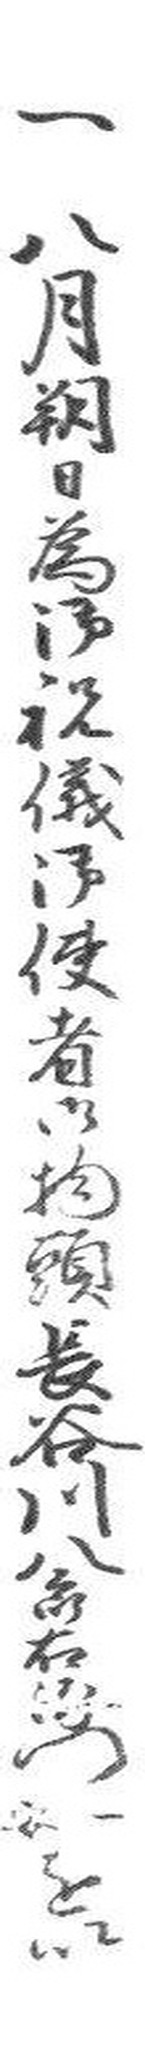一八月朔日為御祝儀御使者御物頭長谷川八郎右衛門一安を以
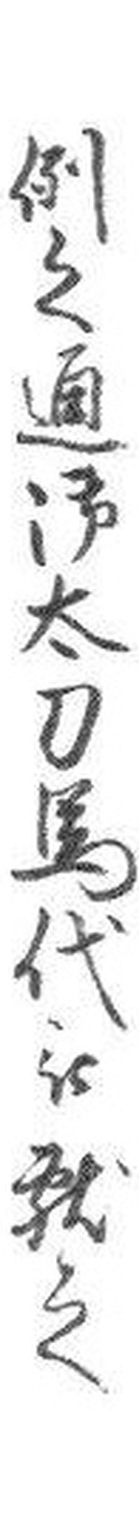例之通御太刀馬代被献之
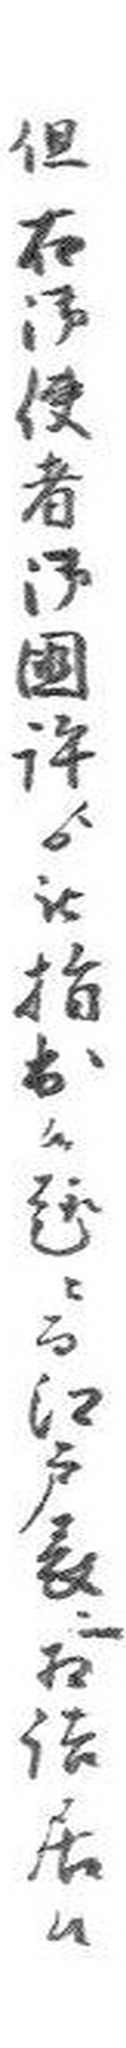但右御使者御国許ゟ被指出候趣ニ而江戸表ニ相詰居候
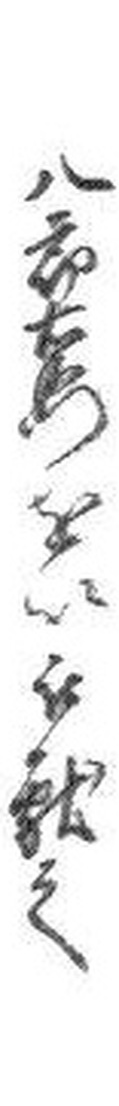八郎右衛門を以被献之
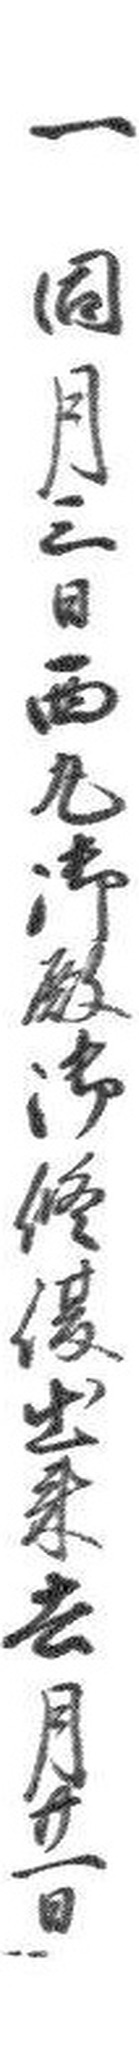一同月三日西丸御殿御修復出来去月廿一日
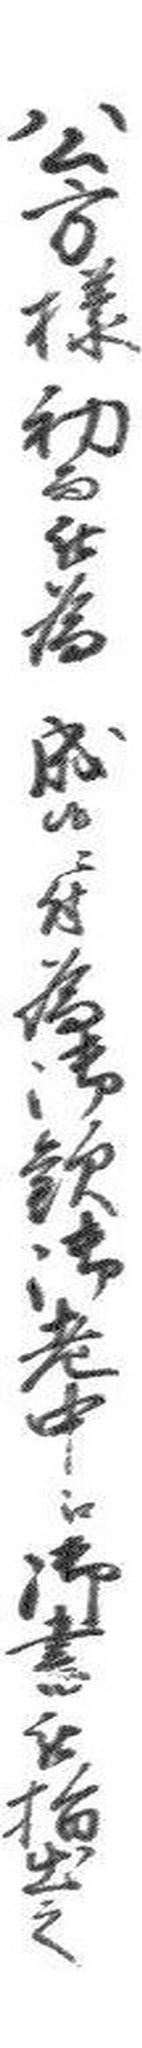公方様始而被為成候ニ付為御歓御老中江御書被指出之
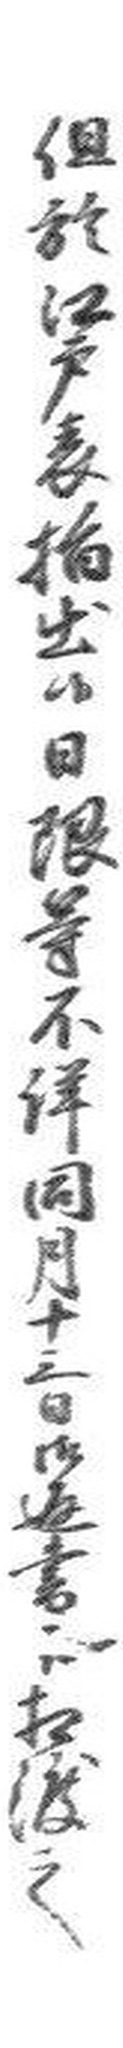但於江戸表指出候日限等不詳同月十三日御返書被相渡之
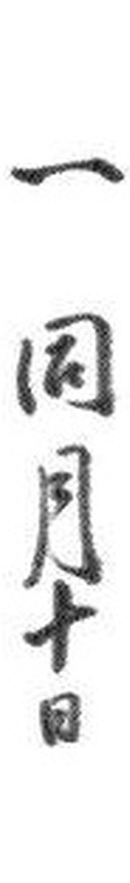一同月十日
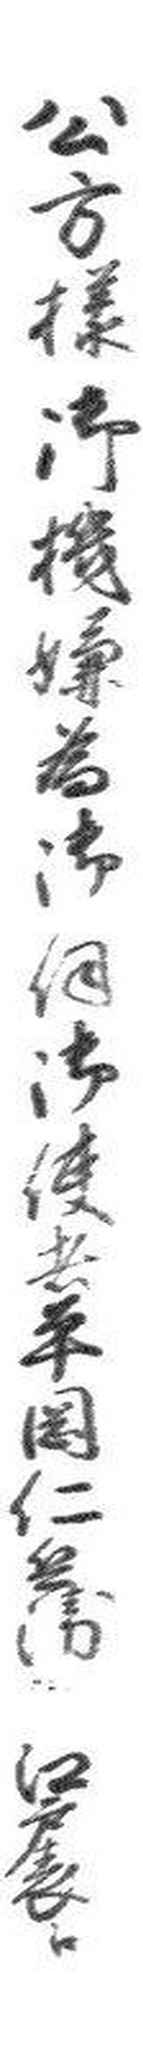公方様御機嫌為御伺御使者平岡仁兵衛平江戸表江
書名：家譜 七 光通公 従寛文四年到同九年
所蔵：福井県文書館 Fukui Prefectural Archives
